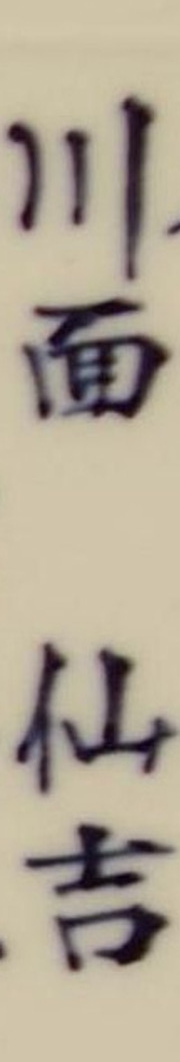川面仙吉
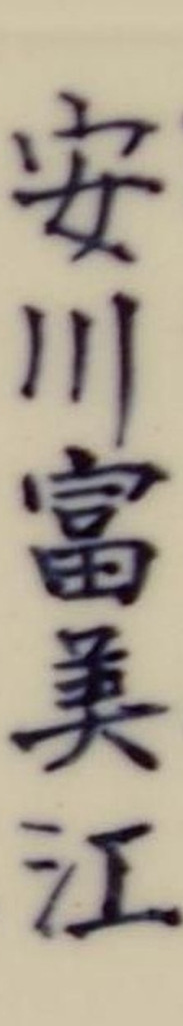安川富美江
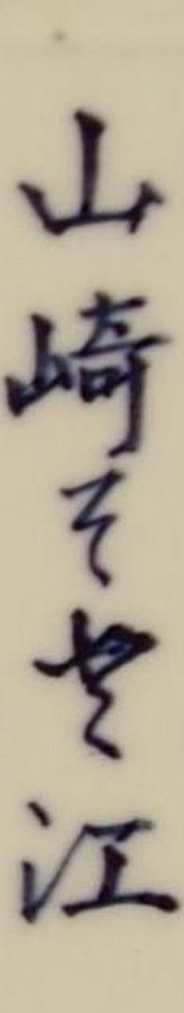山崎そと江
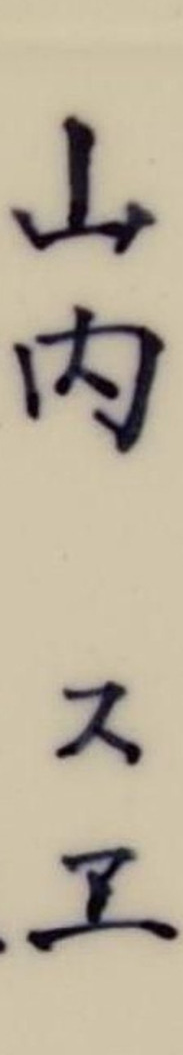山内スエ
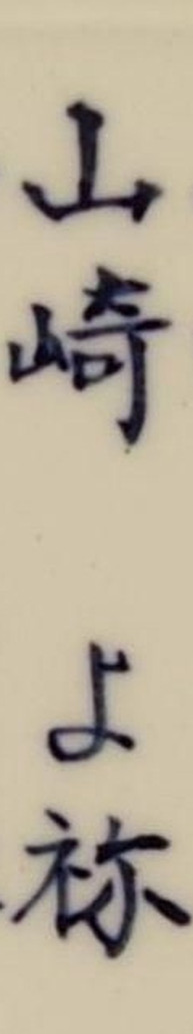山崎よね
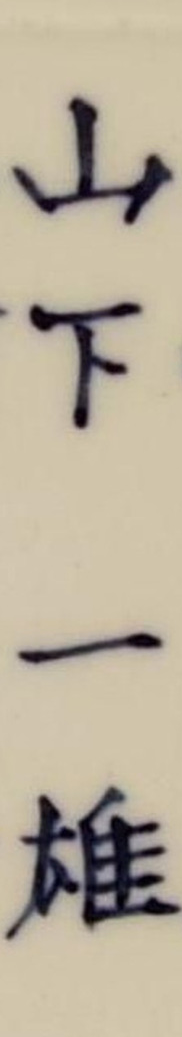山下一雄
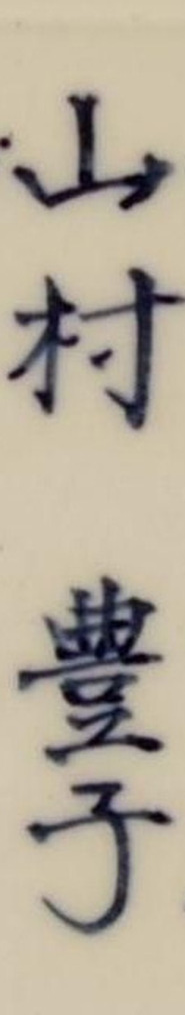山村豊子
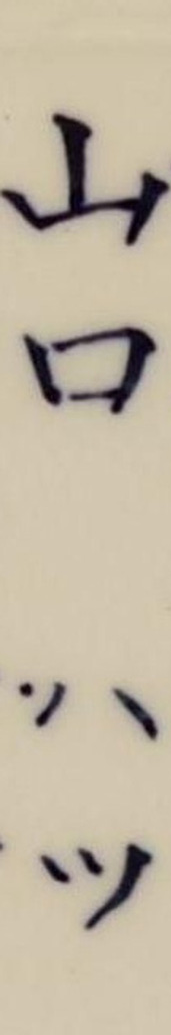山口ハツ
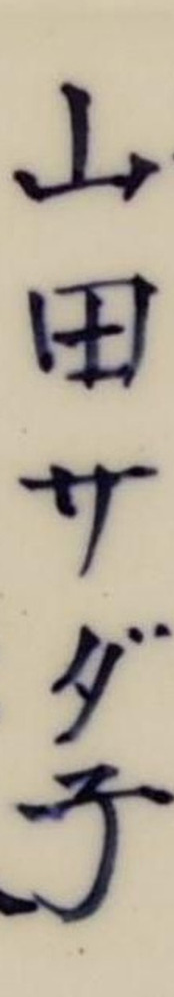山田サダ子
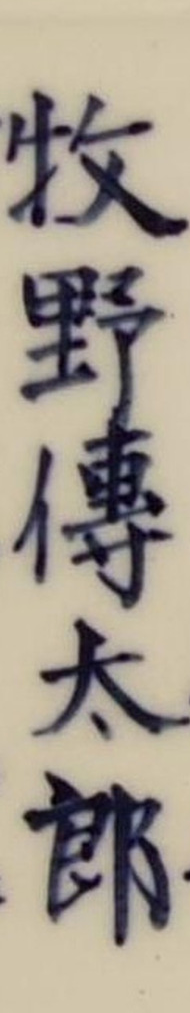牧野傳太郎
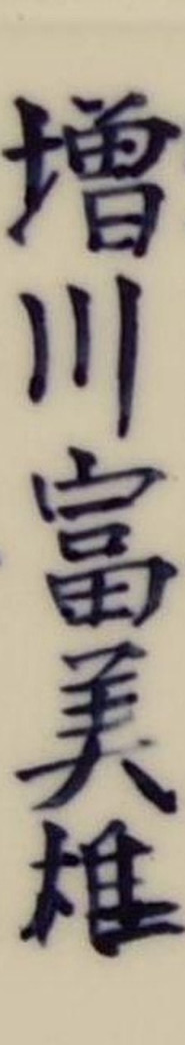増川富美雄
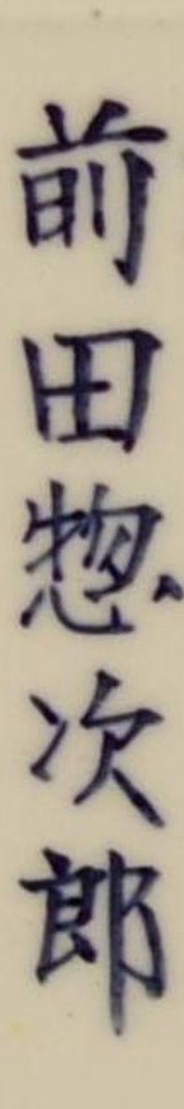前田惣次郎
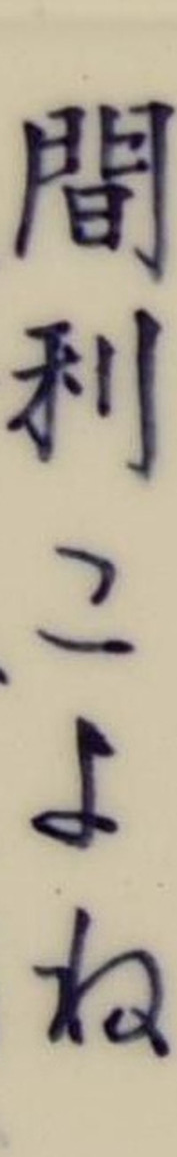間利こよね
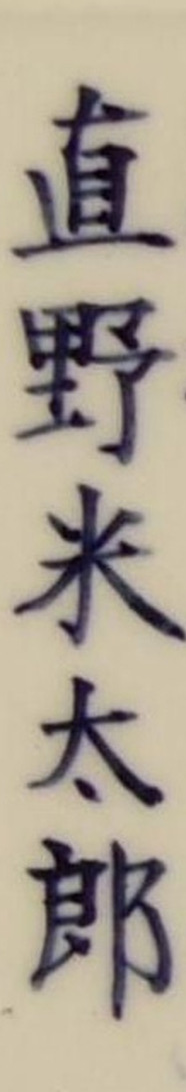直野米太郎
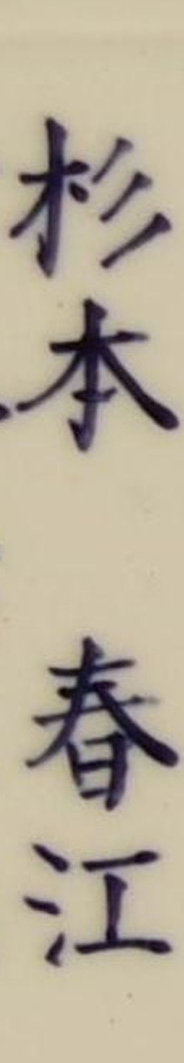杉本春江
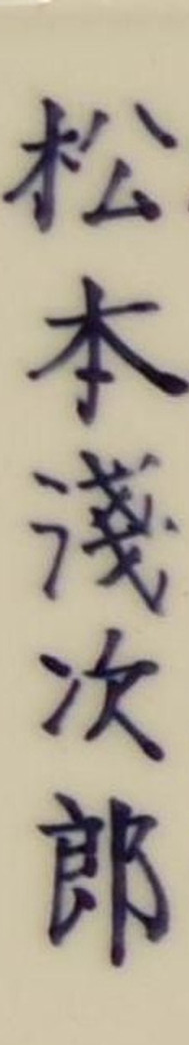松本浅次郎
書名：E~L
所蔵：高野山金剛峯寺
